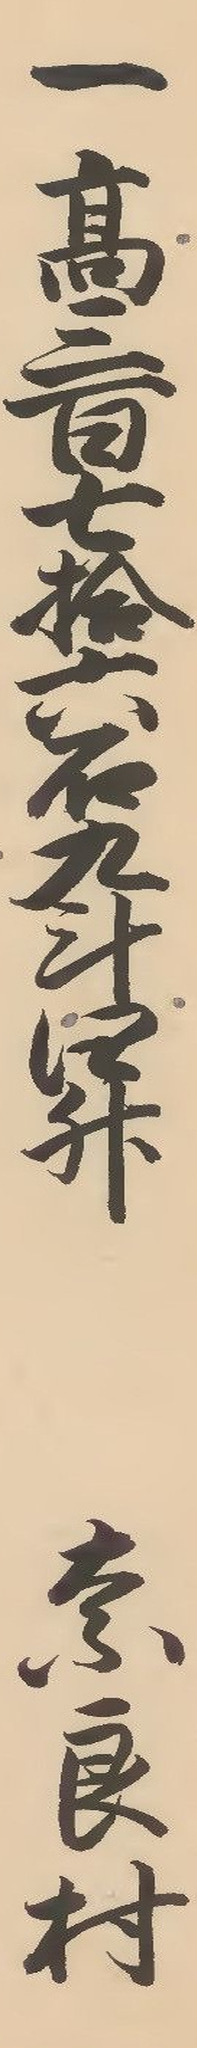一高三百七拾六石九斗四升奈良村
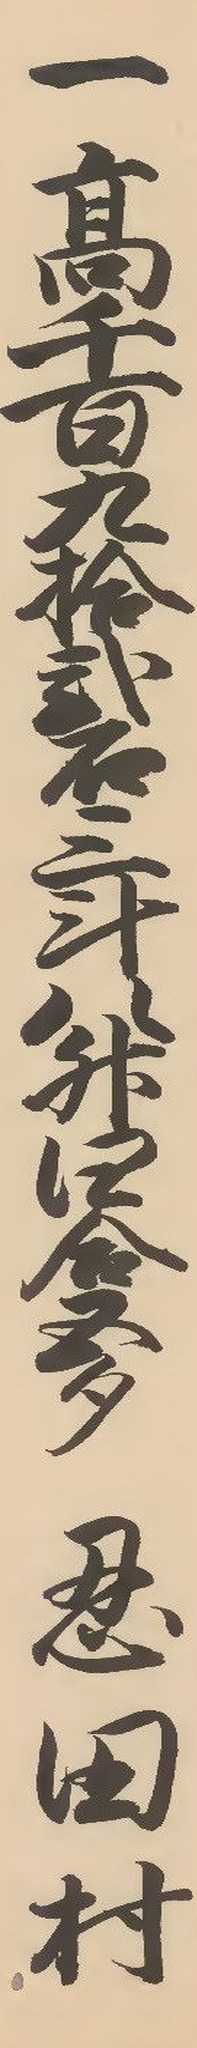一高千百九拾弐石三斗八升四合五勺忍田村
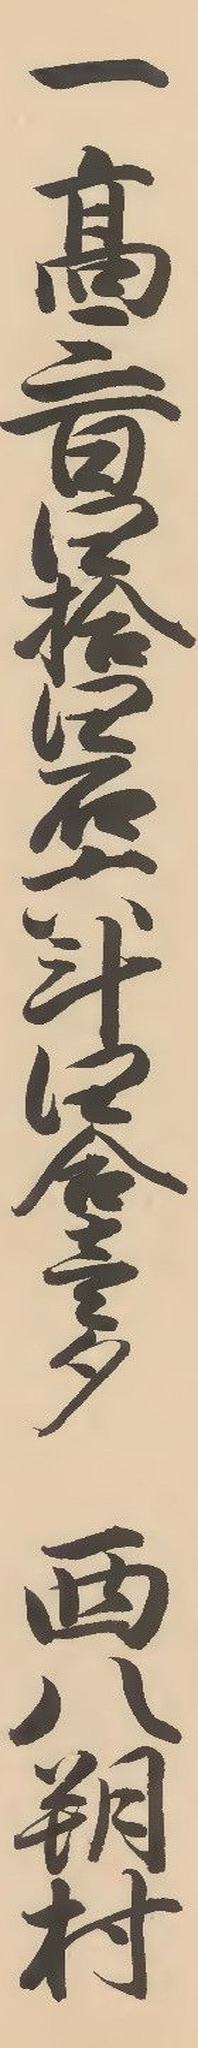一高三百四拾四石六斗四合壱勺西八朔村
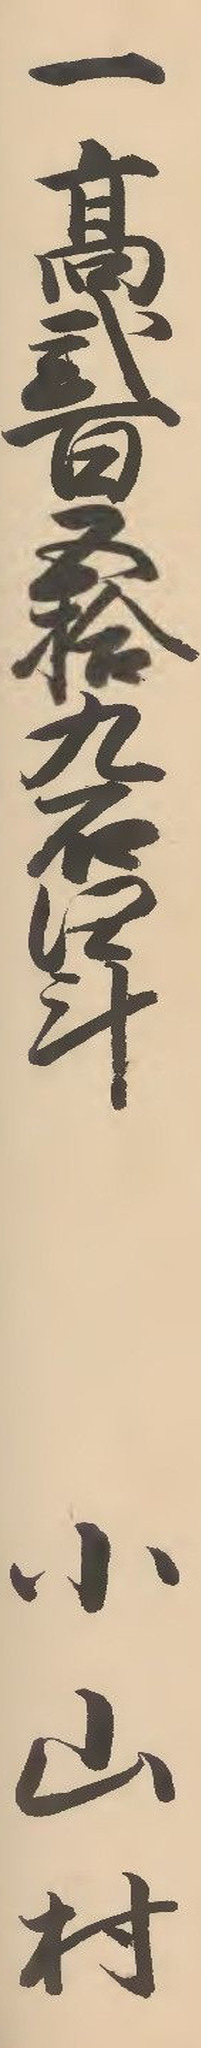一高弐百五拾九石四斗小山村
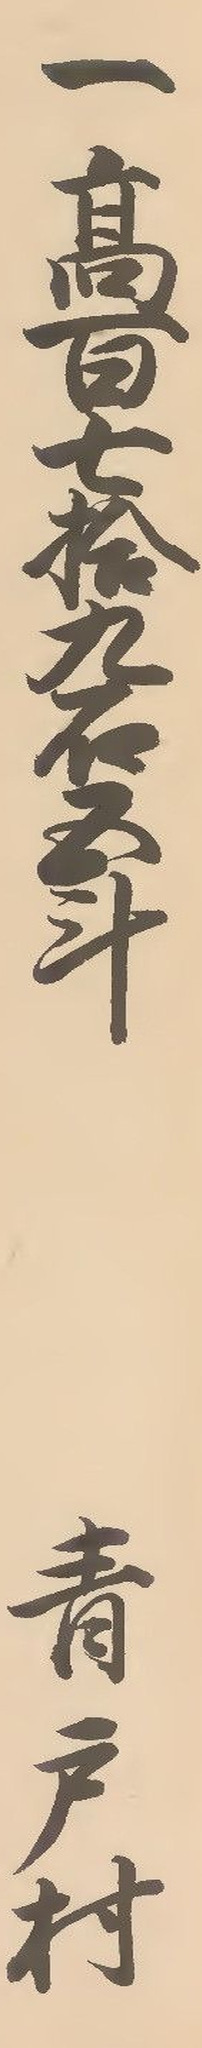一高百七拾九石五斗青戸村
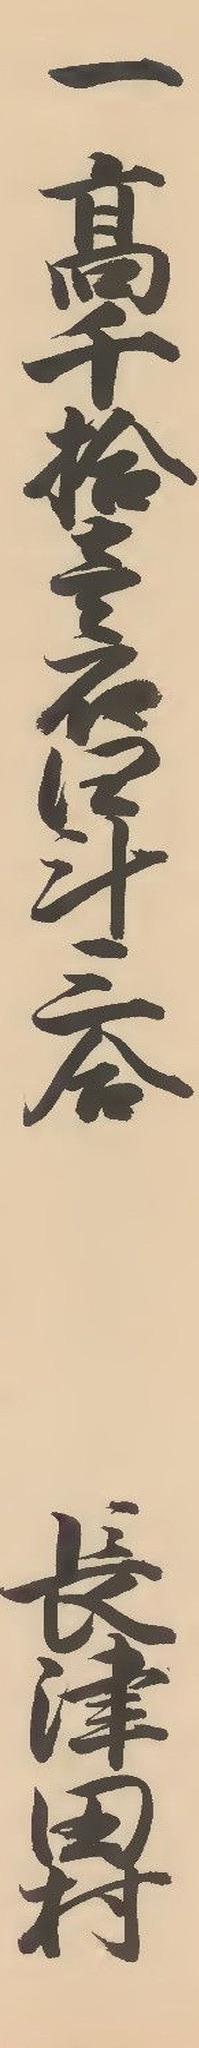一高千拾壱石四斗三合長津田村
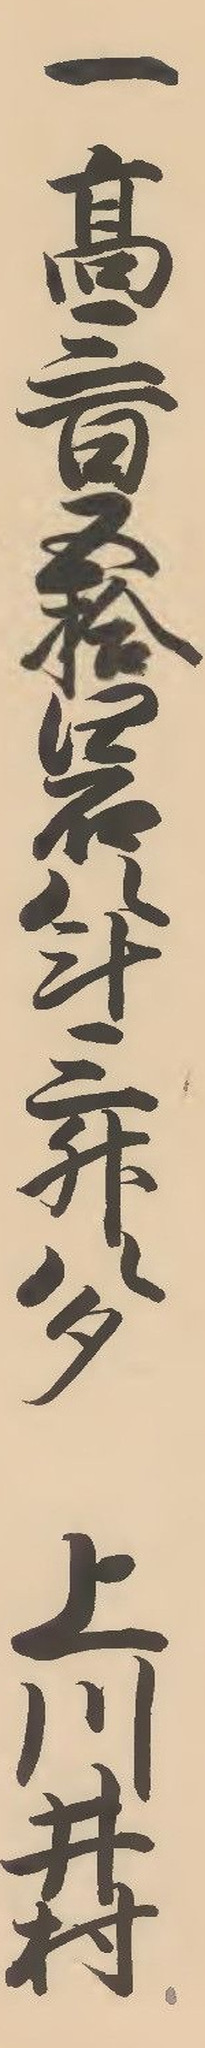一高三百五拾四石八斗三升八勺上川井村
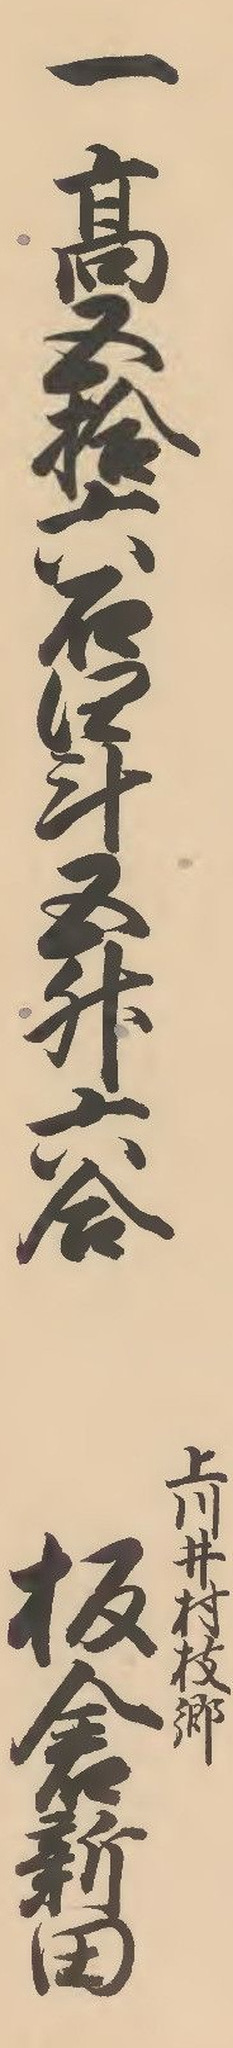一高五拾六石四斗五升六合板倉新田

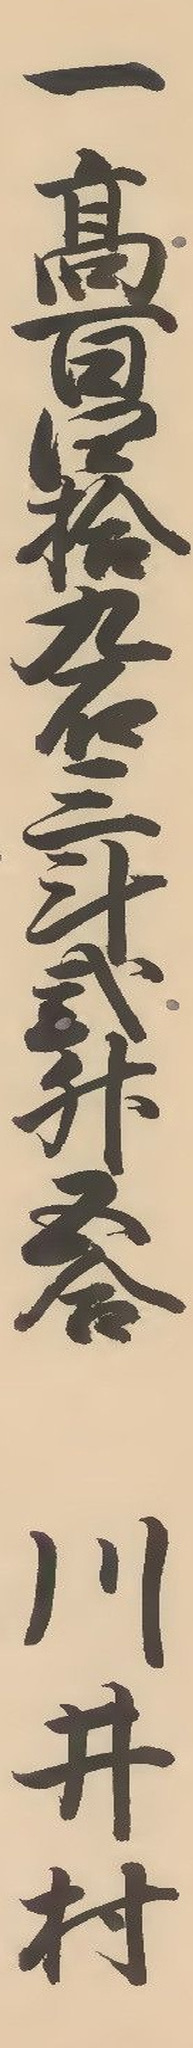一高百四拾九石三斗弐升五合川井村
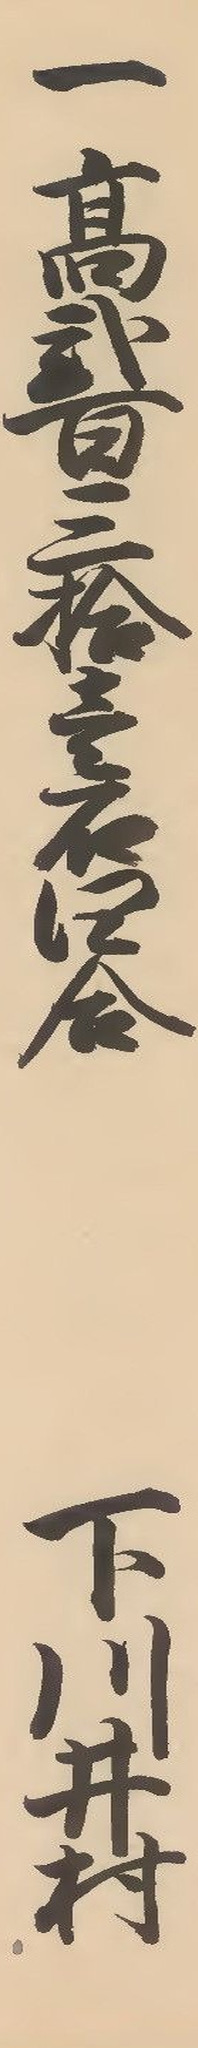一高弐百三拾壱石四合下川井村
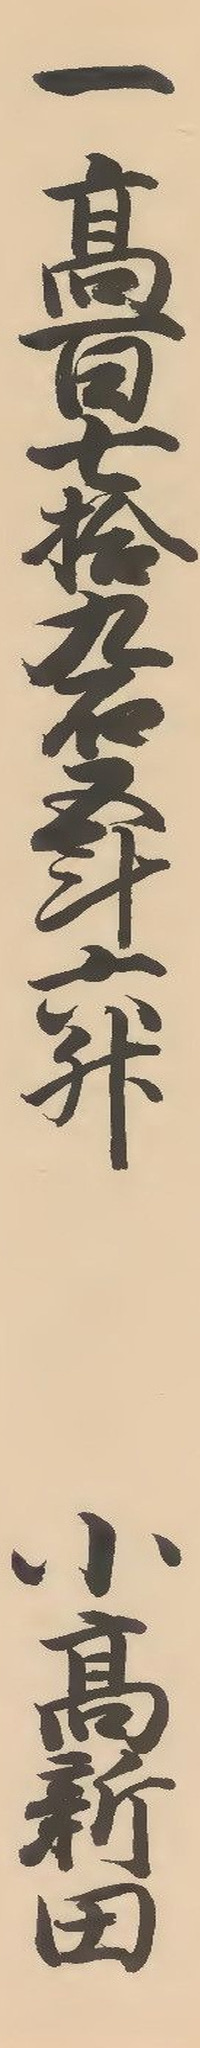一高百七拾九石五斗六升小高新田
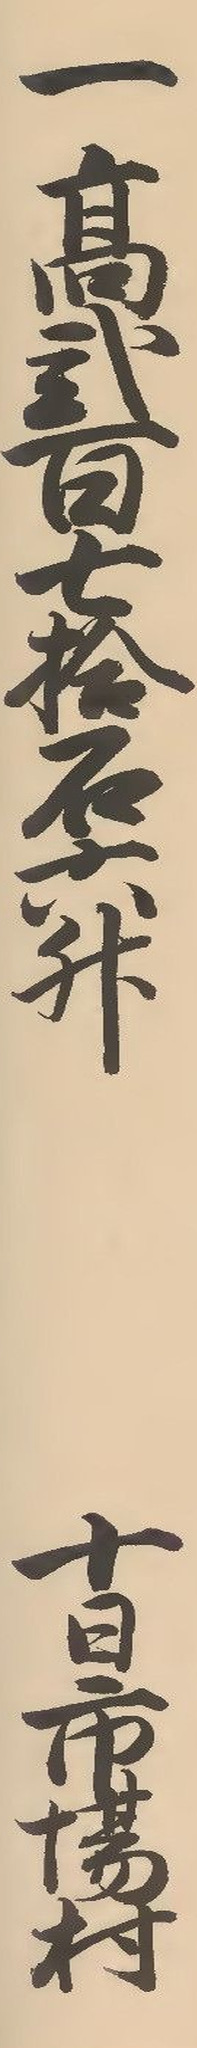一高弐百七拾石六升十日市場村
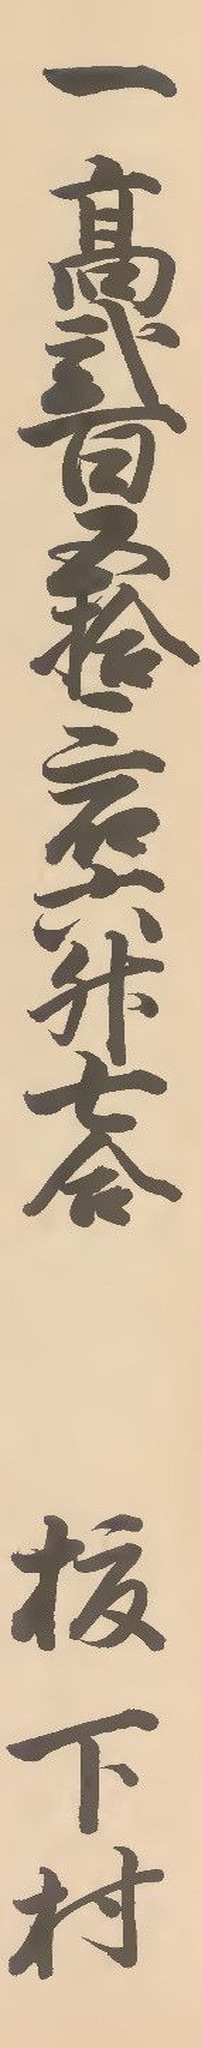一高弐百五拾三石六升七合榎下村
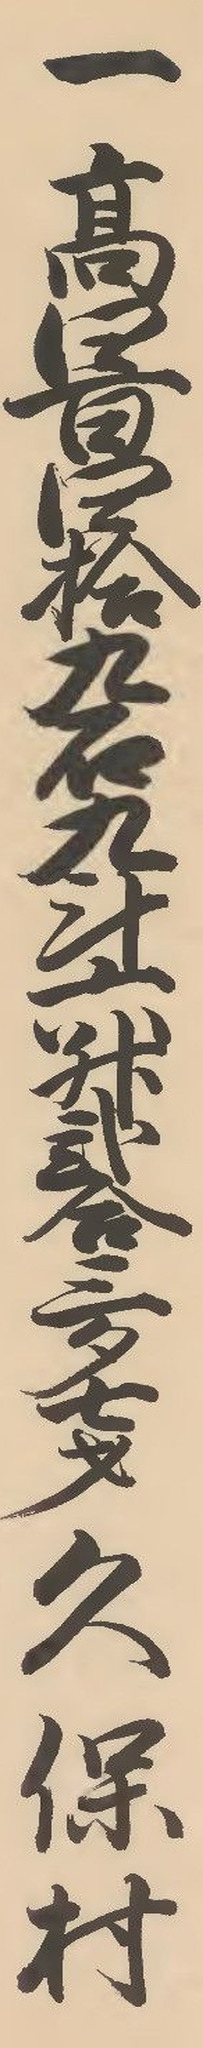一高四百四拾九石九斗六升弐合三勺七才久保村
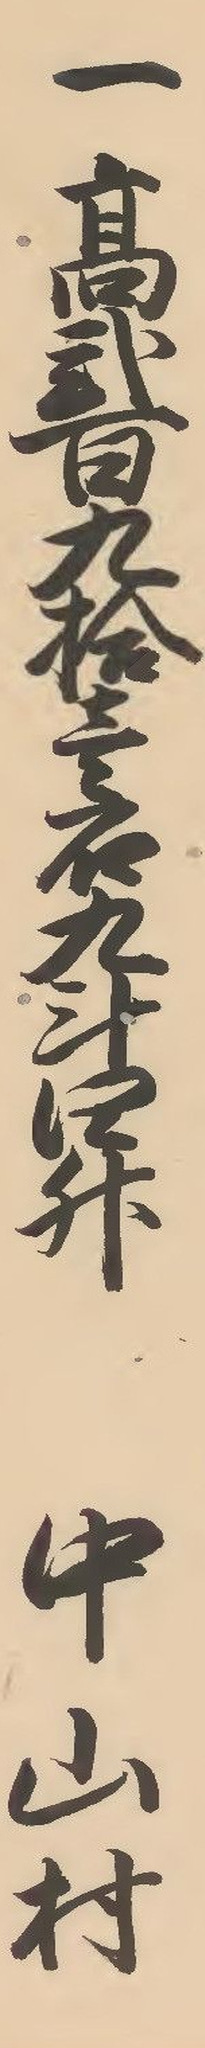一高弐百九拾壱石九斗四升中山村

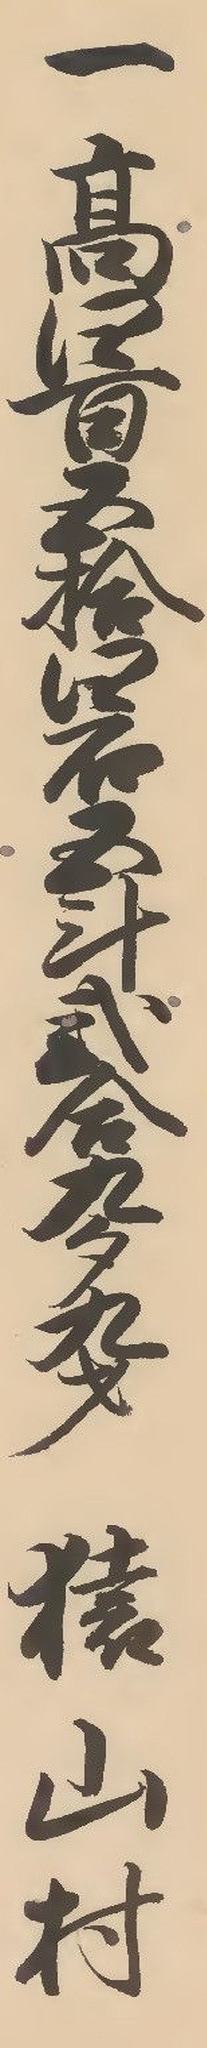一高四百五拾四石五斗弐合九勺九才猿山村
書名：武蔵国郷帳　上
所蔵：国立公文書館 National Archives of Japan
